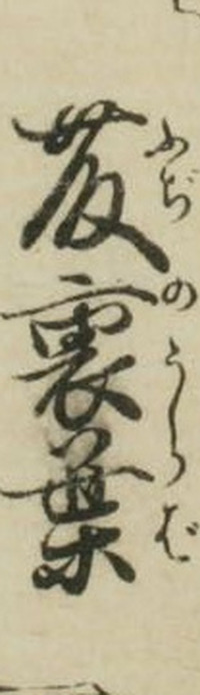藤裏葉
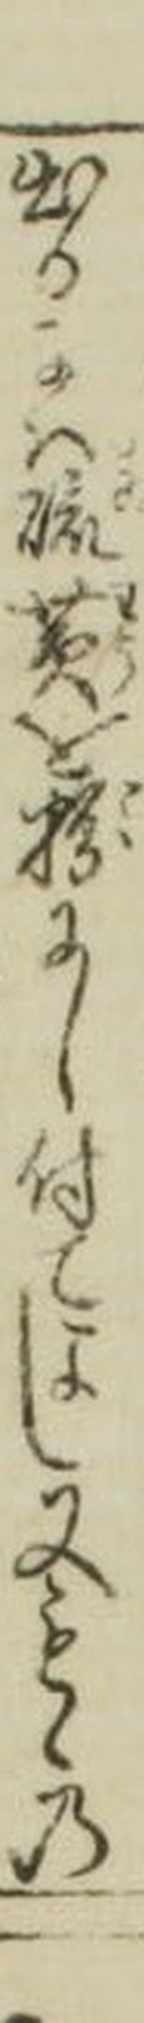出るには。硫黄を粉にし付てよし又もゝの
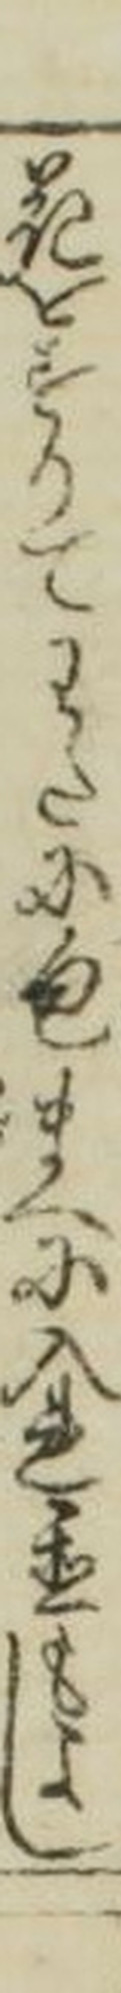花をすりてわたに包まへに入れ置もよし
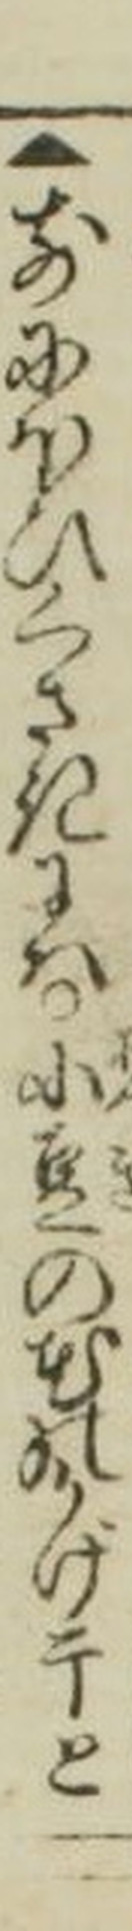▲前にほひくさきには◯小豆の花のかげ干と
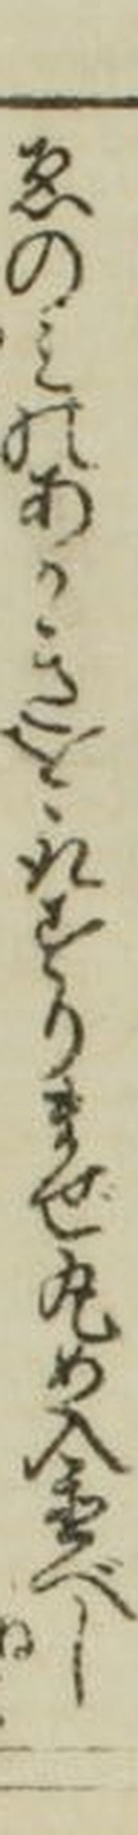ゑのみのあかきを取すりまぜ丸め入置べし
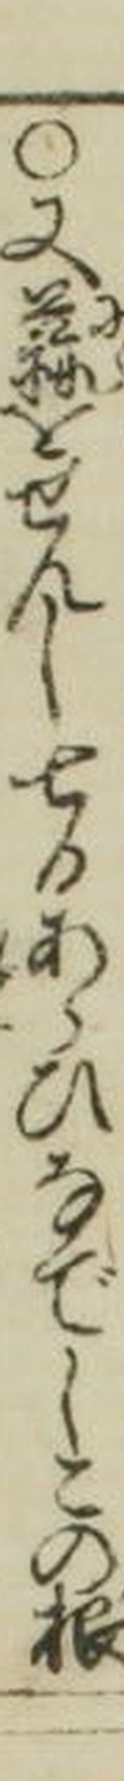◯又韮をせんし七日あらひなでしこの根
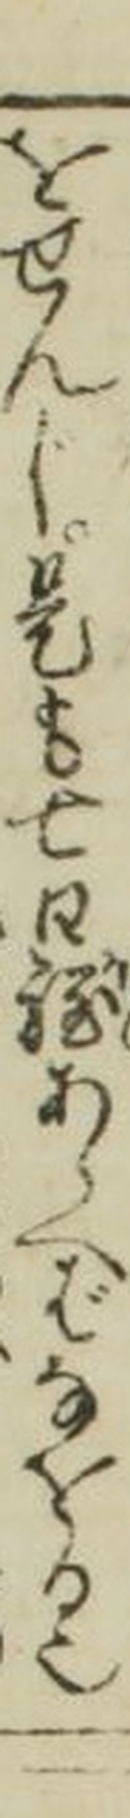をせんじ。是も七日程あらへばなをる也
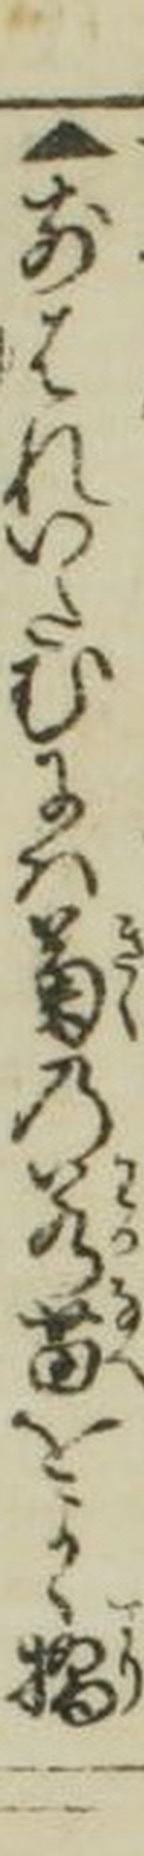▲前はれいたむには菊の若苗をよく摺
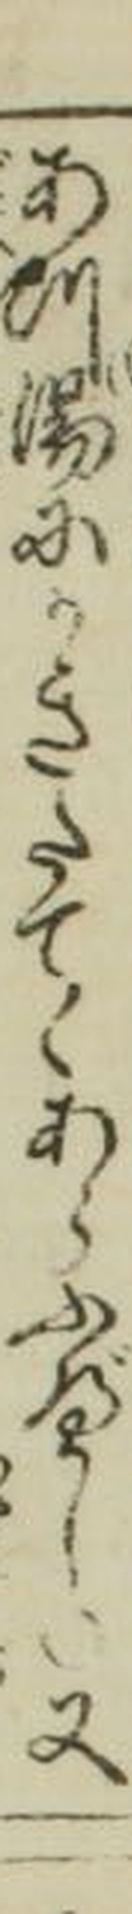あつ湯にかきたてゝあらふべし◯又
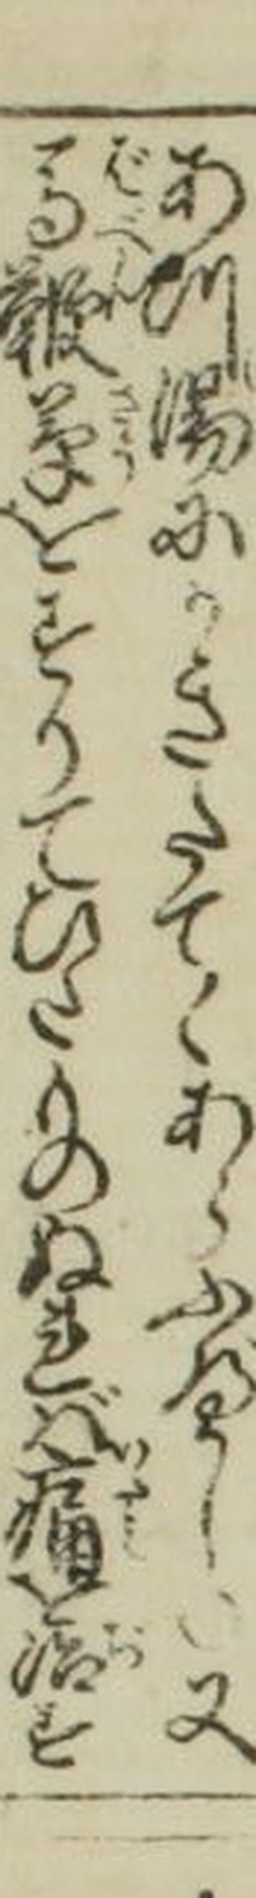馬鞭草をすりてひたものぬれば痛を治す
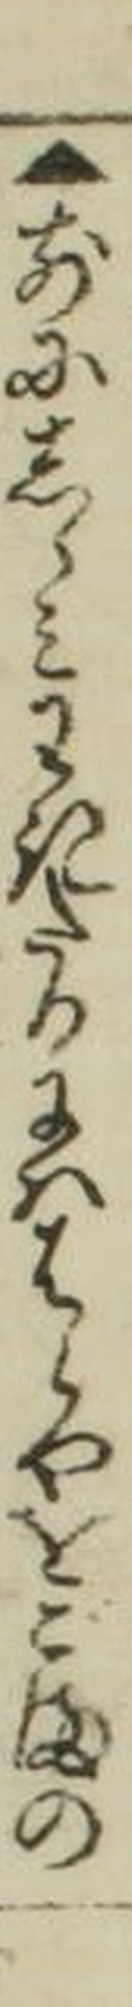▲前にしらみわきたるにははらやをごまの
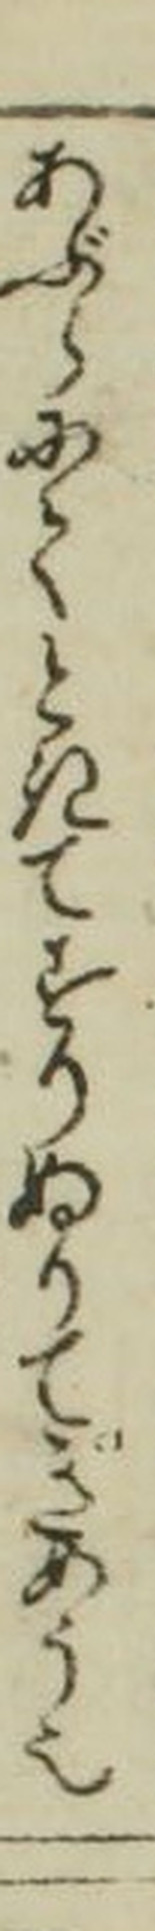あぶらにてときてすりぬりて。きめう也
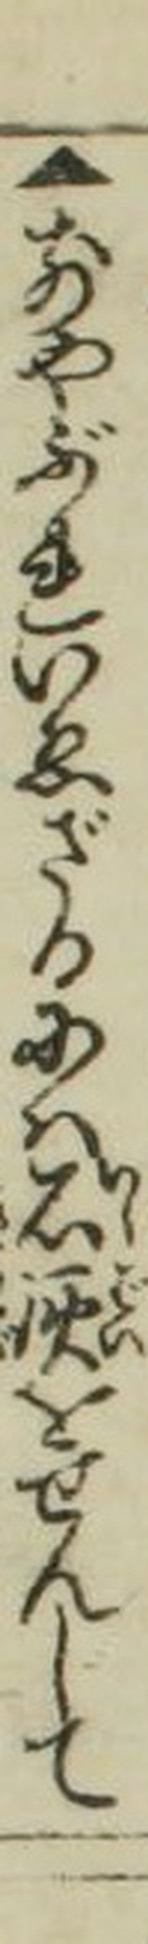▲前やぶれいゑざるには石灰をせんして
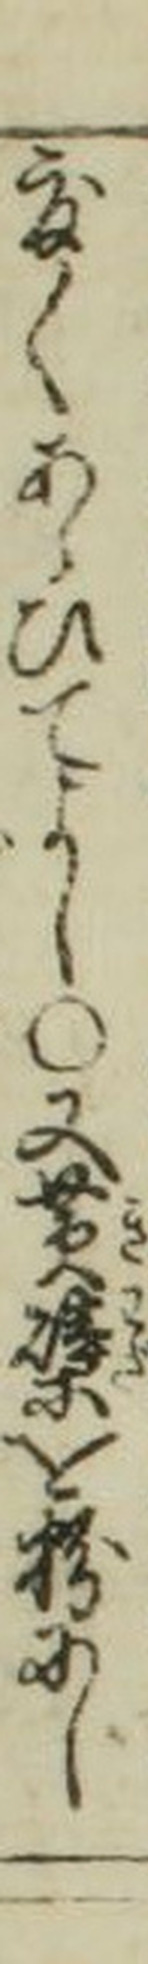度〳〵あらひてよし◯又黄檗を粉にし
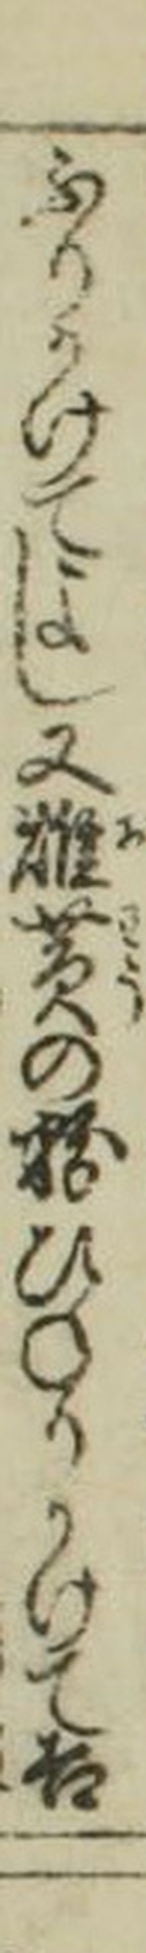ふりかけてよし又雄黄の粉ひねりかけて吉
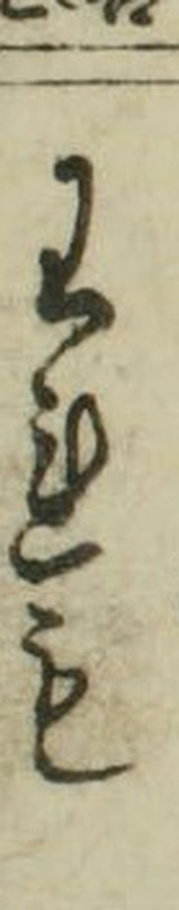われも
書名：女源氏教訓鑑
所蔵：東京学芸大学附属図書館
